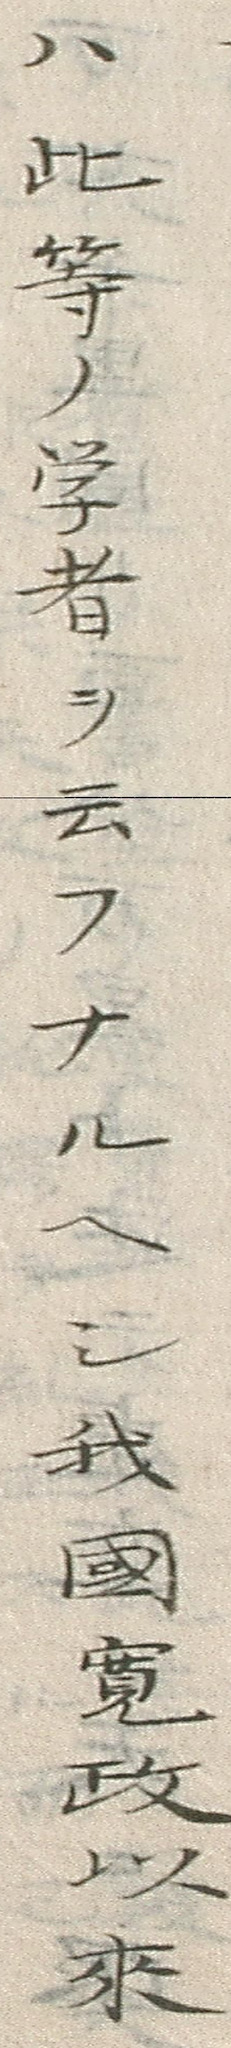ハ此等ノ学者ヲ云フナルヘシ我国寛政以来
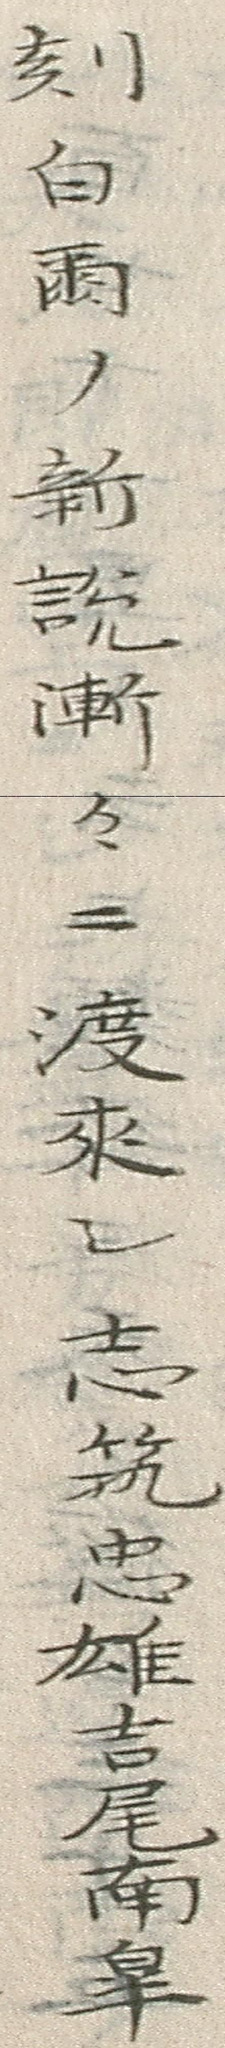刻白爾ノ新説漸々ニ渡来シ志筑忠雄吉尾南皐
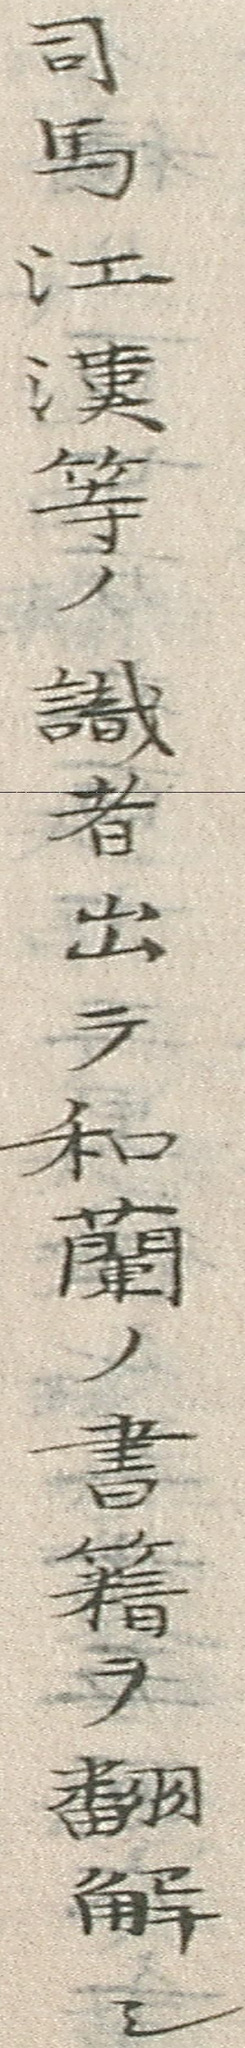司馬江漢等ノ識者出テ和蘭ノ書籍ヲ翻解シ
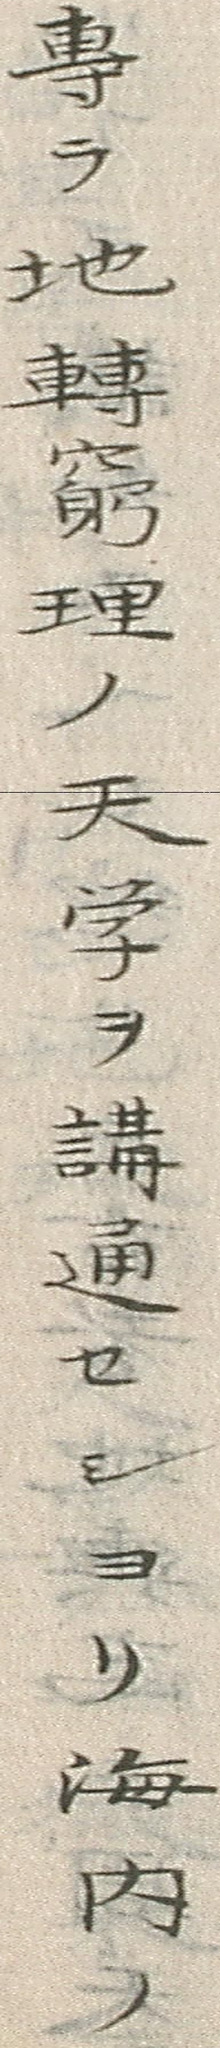専ラ地転窮理ノ天学ヲ講通セシヨリ海内ノ
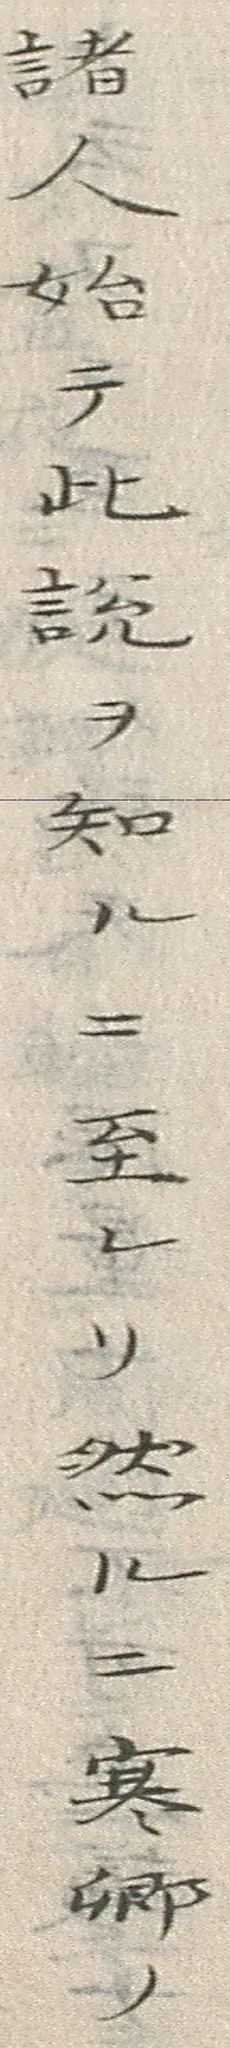諸人始テ此説ヲ知ルニ至レリ然ルニ寒卿ノ
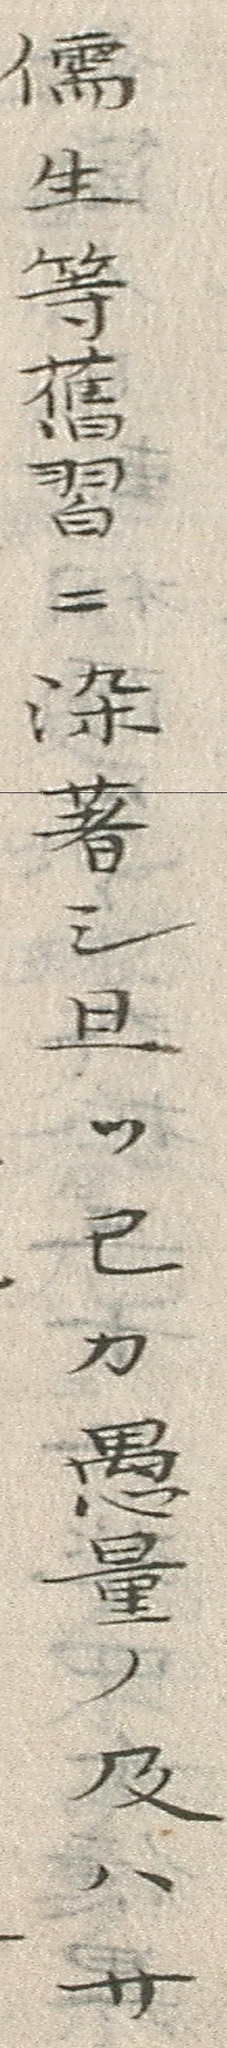儒生等旧習ニ染著シ且ツ己カ愚量ノ及ハサ
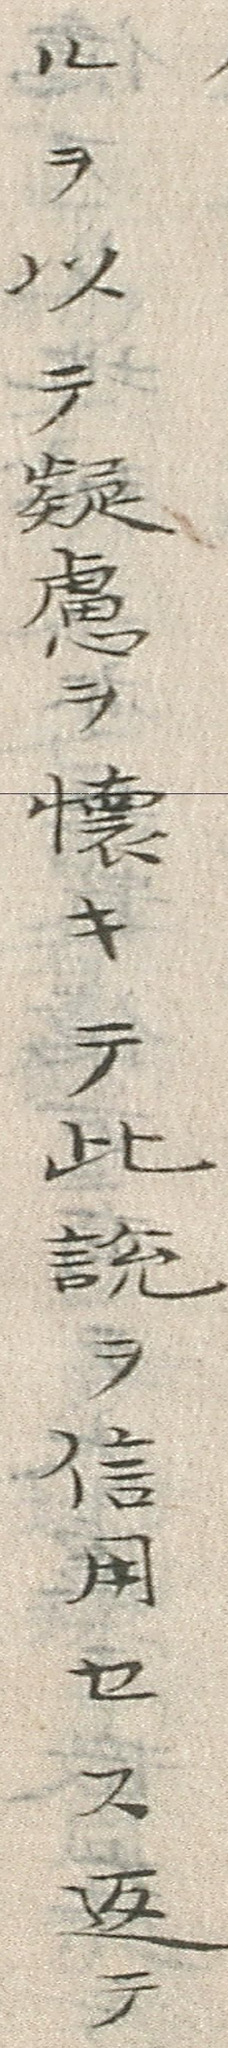ルヲ以テ疑慮ヲ懐キテ此説ヲ信用セス返テ
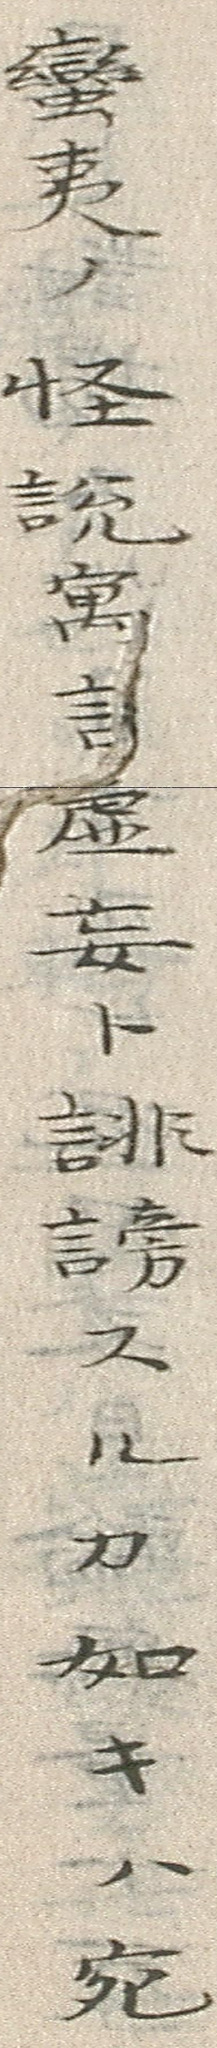蛮夷ノ怪説寓言虚妄ト誹謗スルカ如キハ宛
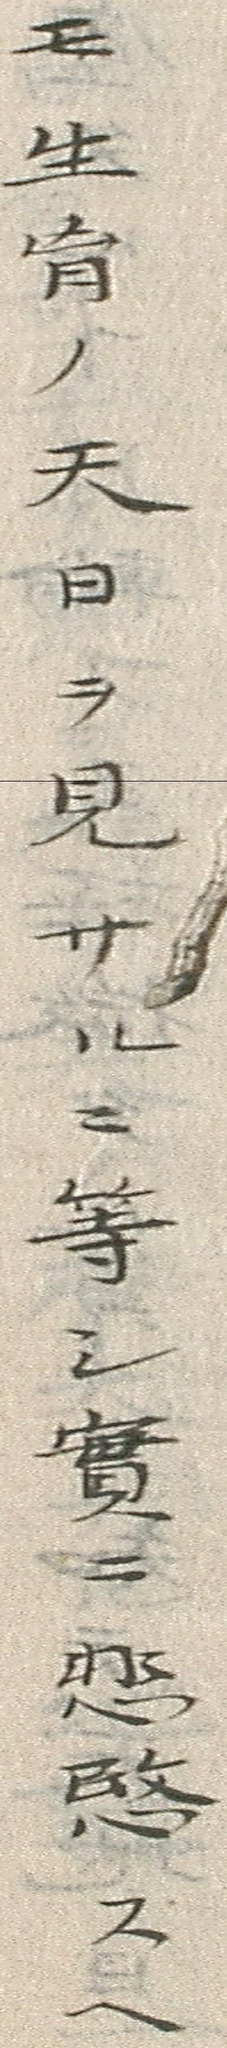モ生骨ノ天日ヲ見サルニ等シ実ニ悲愍スヘ
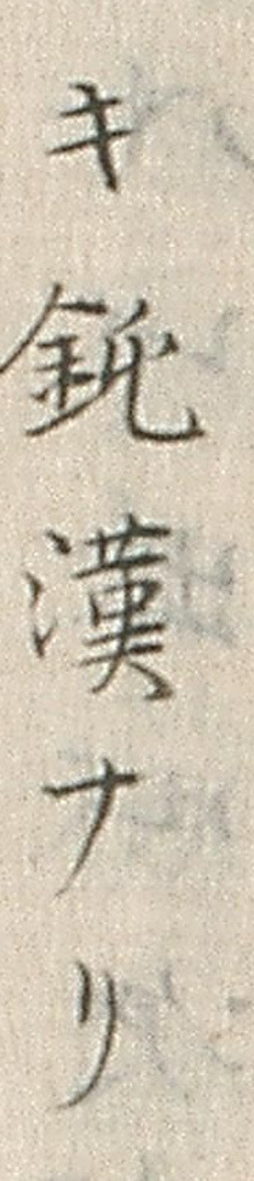キ鈍漢ナリ
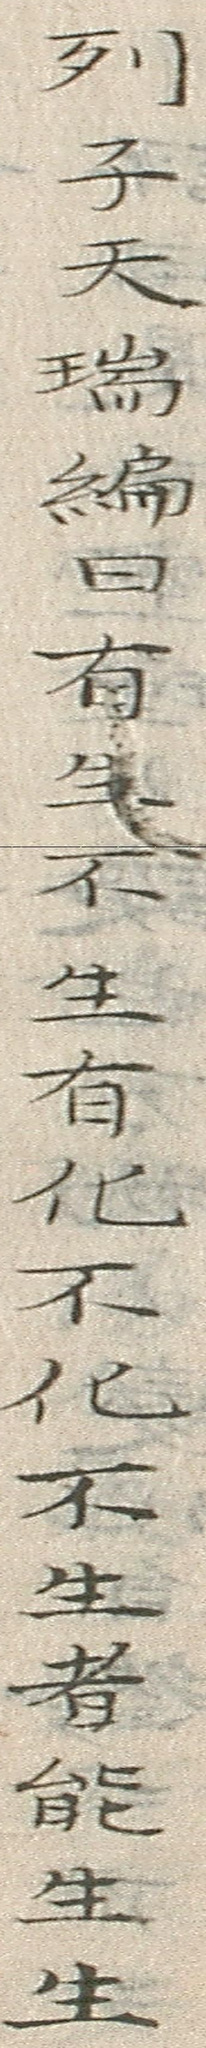列子天瑞編曰有生不生有化不化不生者能生生
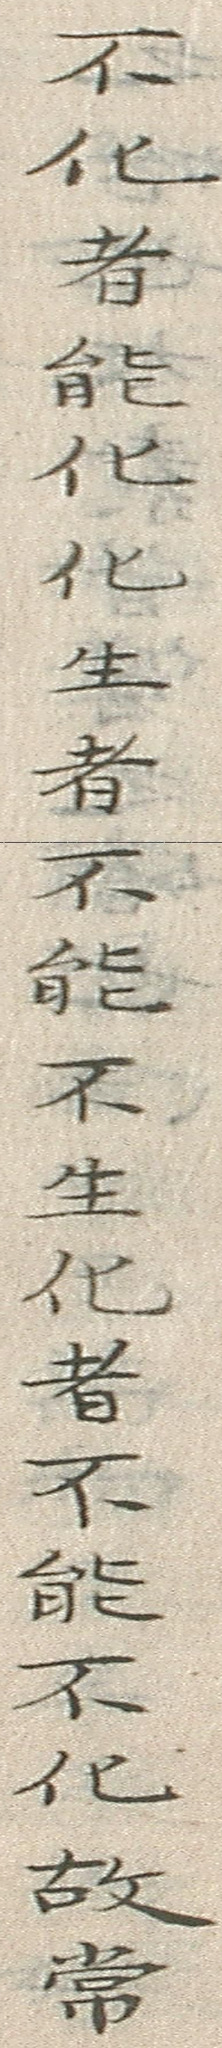不化者能化化生者不能不生化者不能不化故常
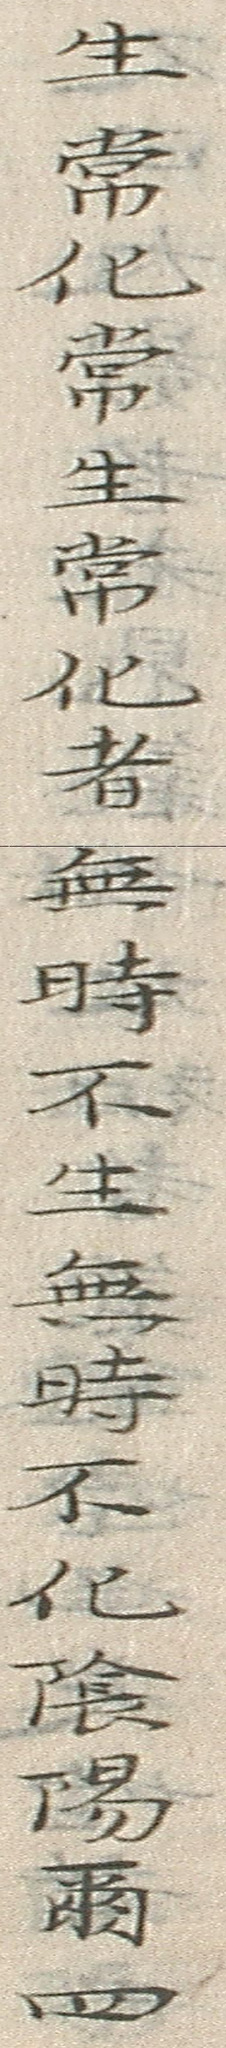生常化常生常化者無時不生無時不化陰陽爾四
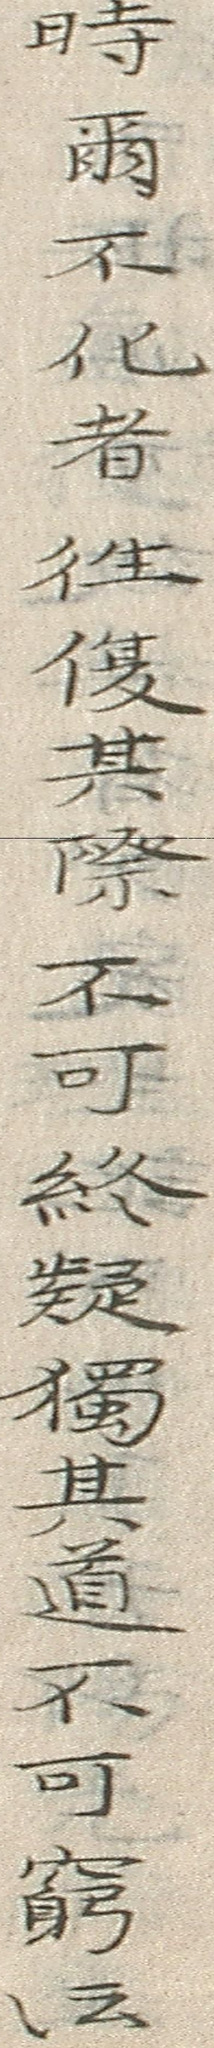時爾不化者往復其際不可終疑独其通不可窮云〻
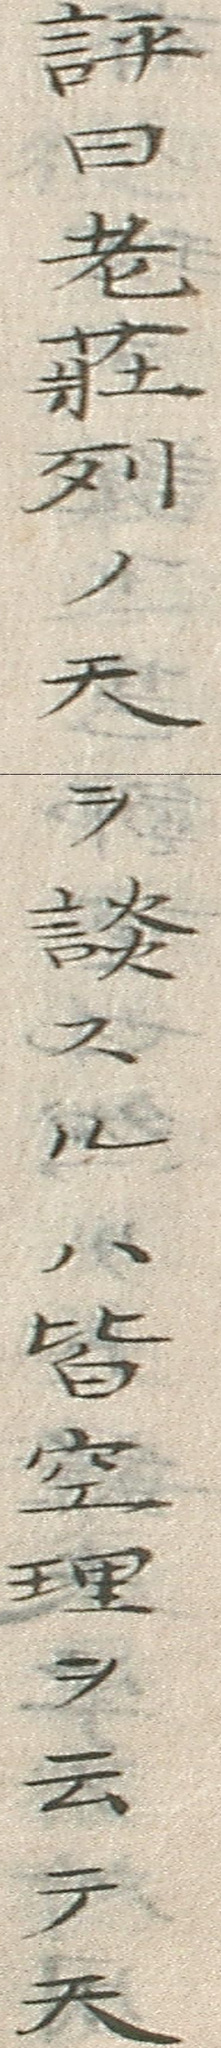評曰老荘列ノ天ヲ談スルハ皆空理ヲ云テ天
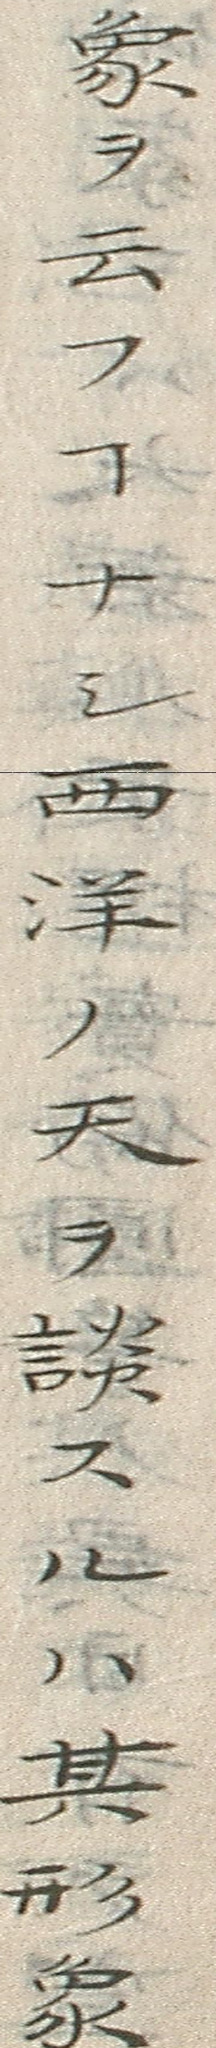象ヲ云フコトナシ西洋ノ天ヲ談スルハ其形象
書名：天學略名目羽翼　全
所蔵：東京大学地震研究所図書室 Earthquake Research Institute Library, The University of Tokyo, JAPAN
